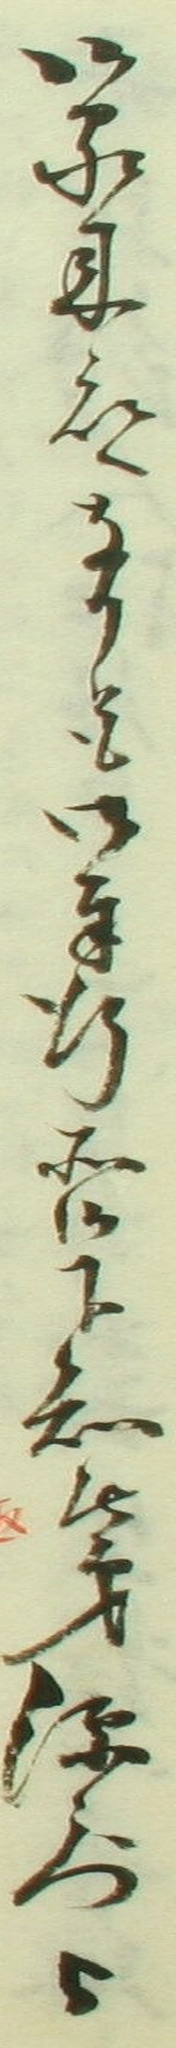御家来衆へなりとも御奉行所御下知次第源右衛門ゟ
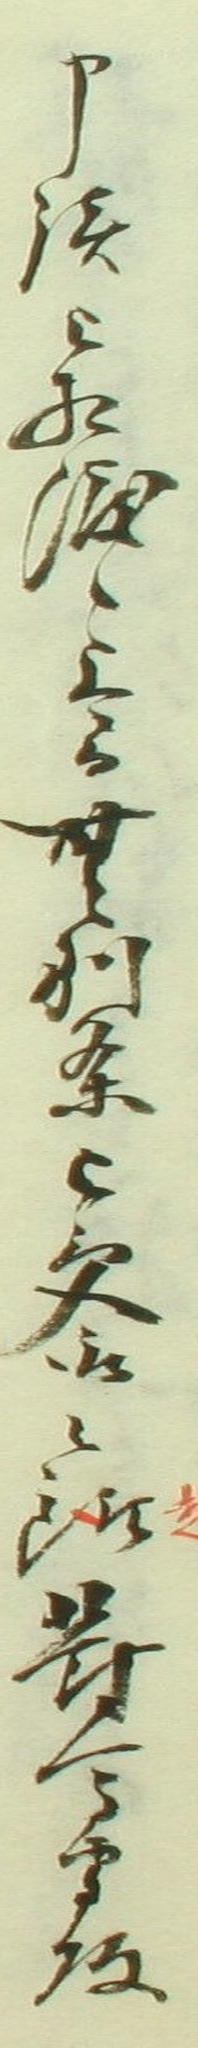申談被相渡候上ニ而無別条被受取候趣対馬守殿
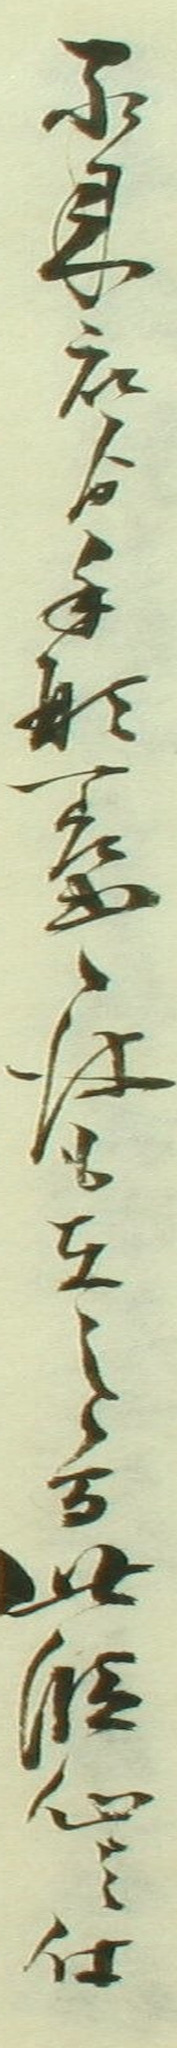家来衆ゟ手形差出候儀も在之候間此段心付
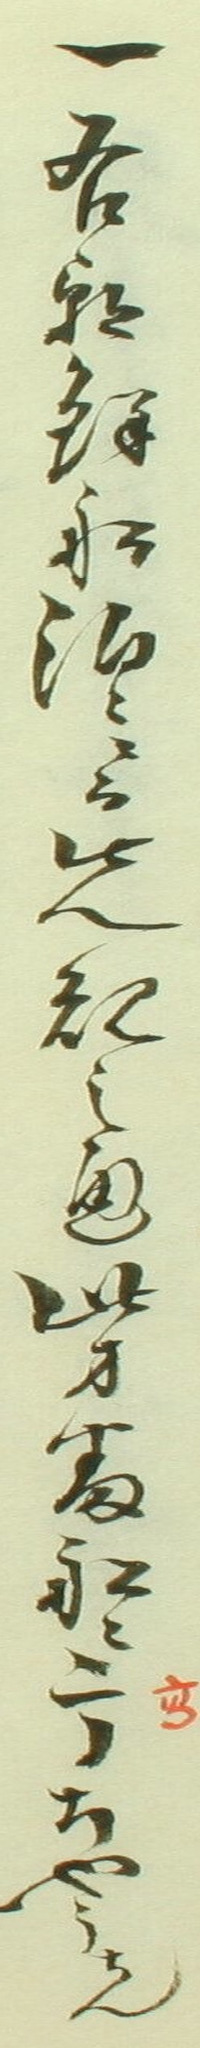一右朝鮮船泊ニ而先規之通此方番船ニちゃうちん
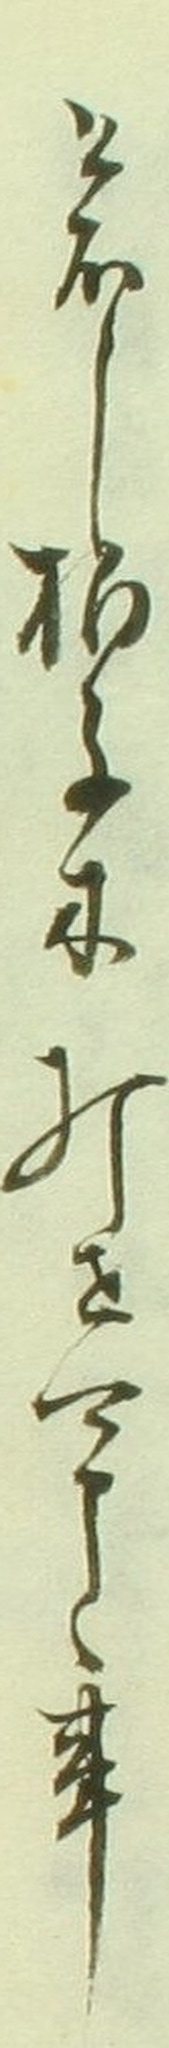着し拍子木打せ可申候事
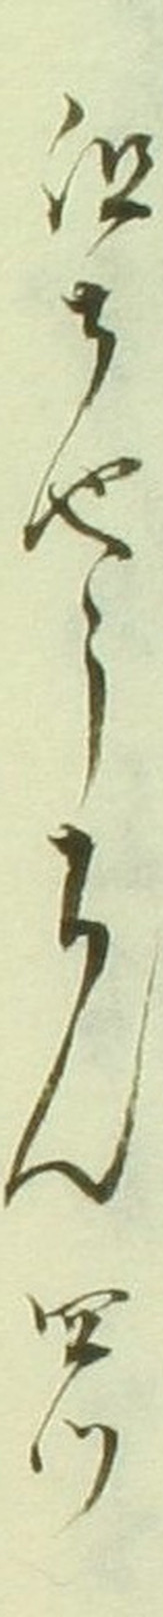但ちゃうちん四ツ
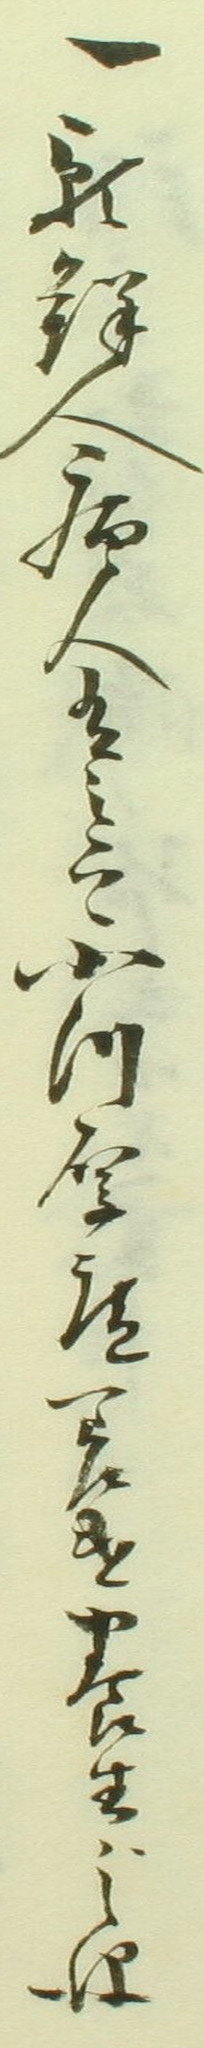一朝鮮人病人有之候ハヽ小川厚庵差遣養生之儀
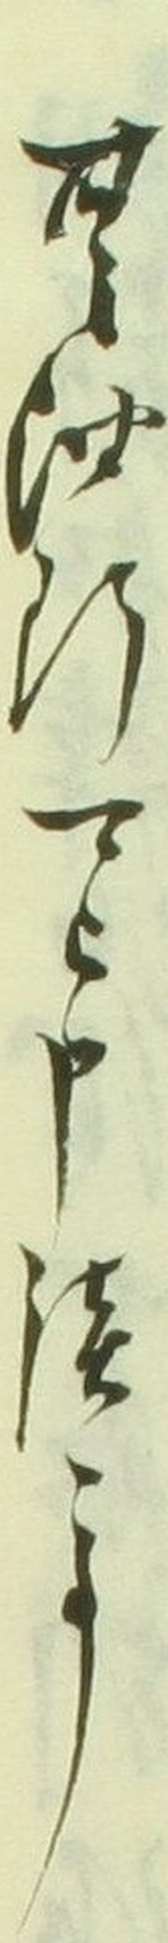無油断可被申談候事
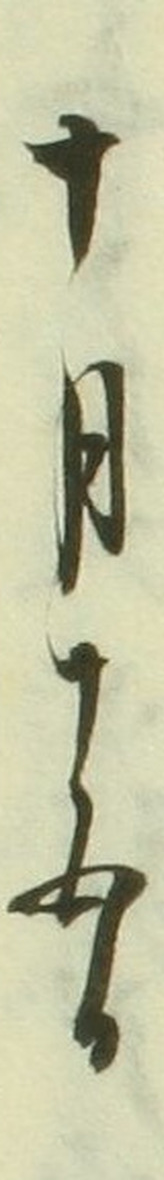十月十五日
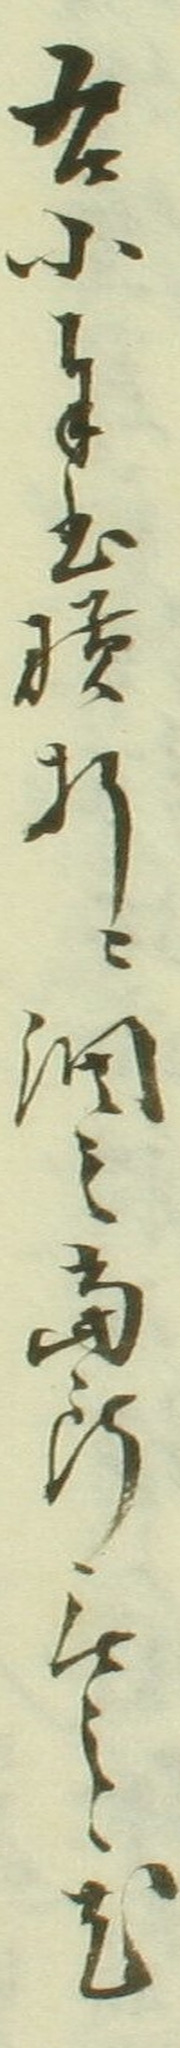右小奉書横折ニ調之当所無之候尤
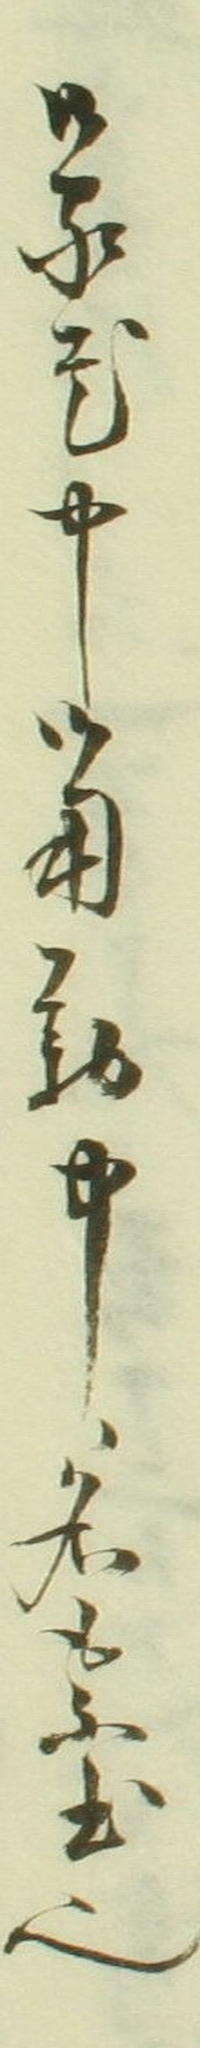御家老中御用勤中へ名も不書也
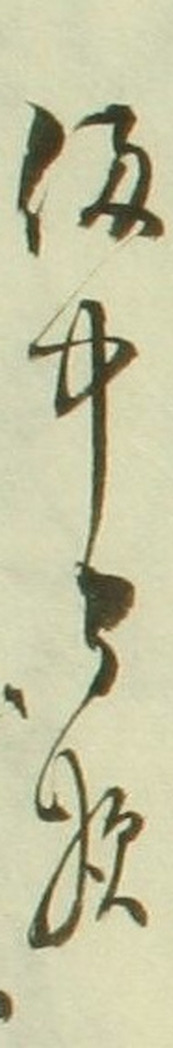備中守様
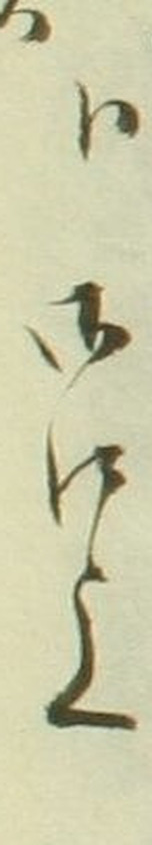江御口上
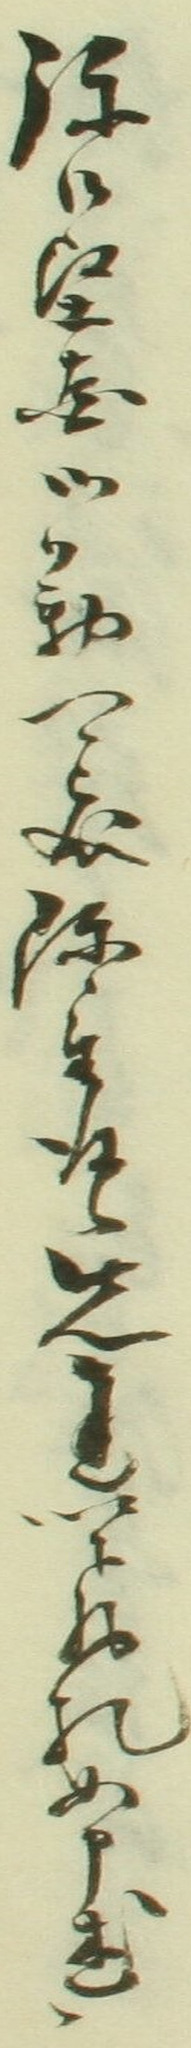弥御堅固御勤可被成弥奉存候先達以飛札如申述候
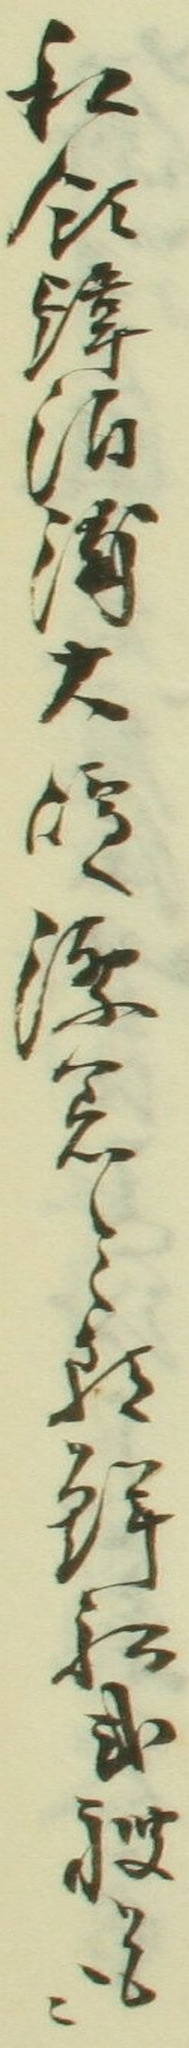私領韓泊浦大嶋へ漂着之朝鮮船弐艘ともニ

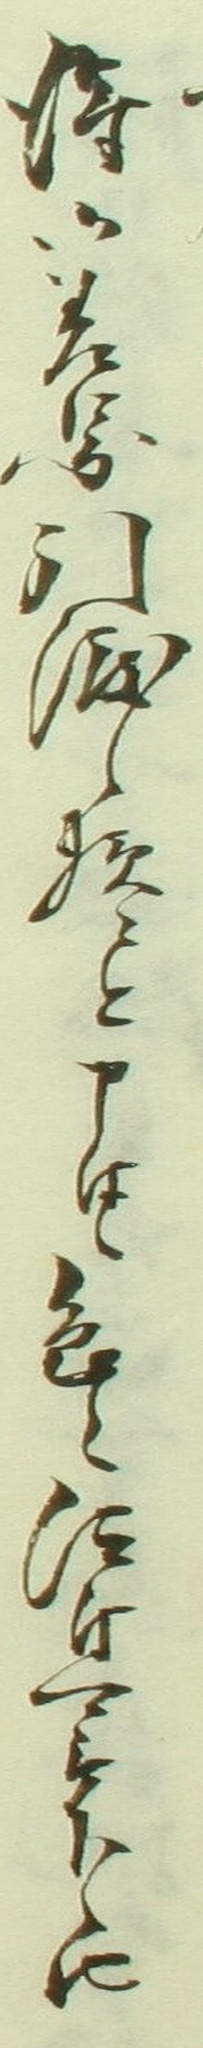得御指図引渡候様ニと申付候色々仰付可被下候由
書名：異国船漂着記
